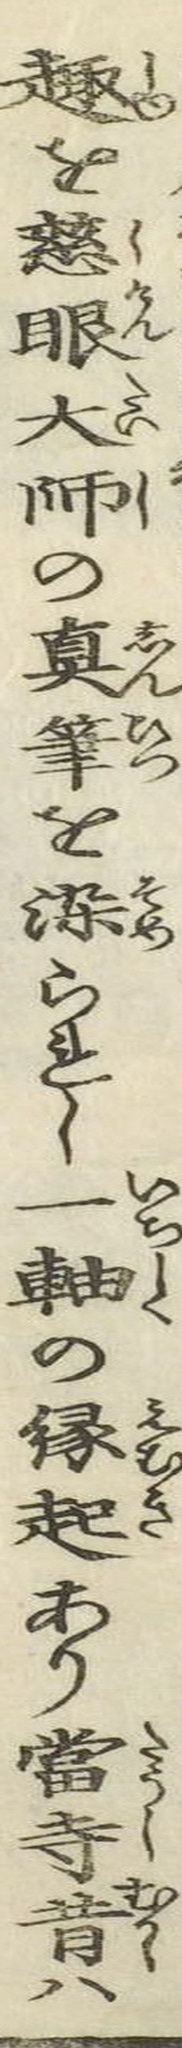趣を慈眼大師の真筆を染られし一軸の縁起あり當寺昔は
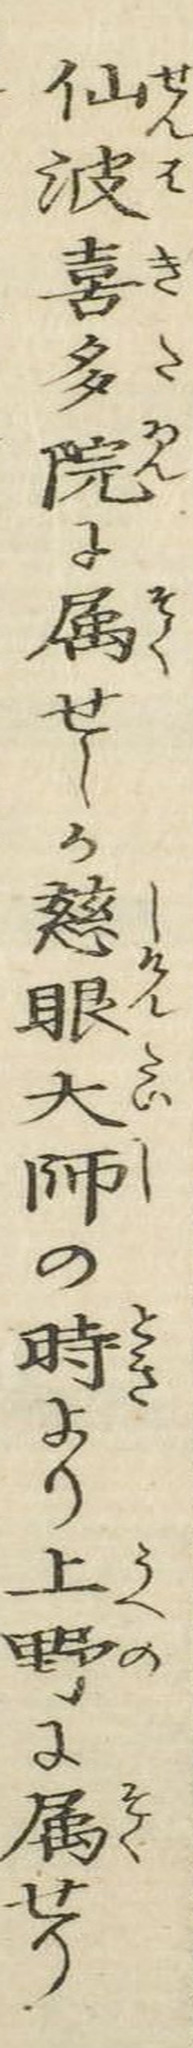仙波喜多院に属せしか慈眼大師の時より上野に属せり
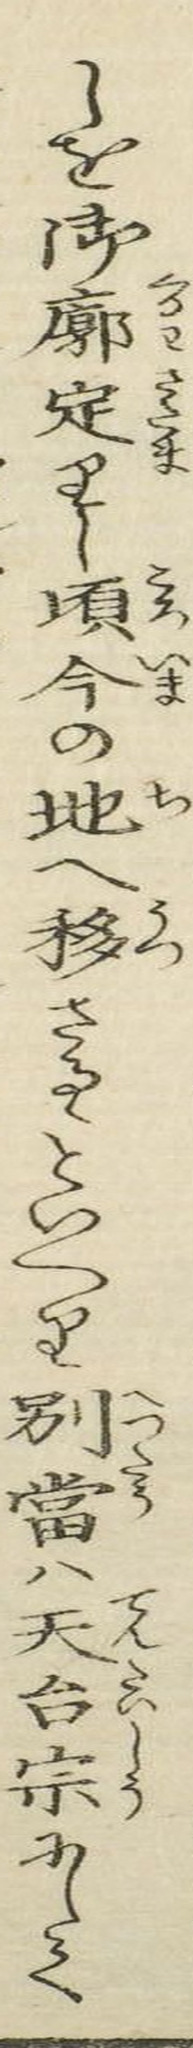しを御廓定りし頃今の地へ移さるゝといへり別當は天台宗にして
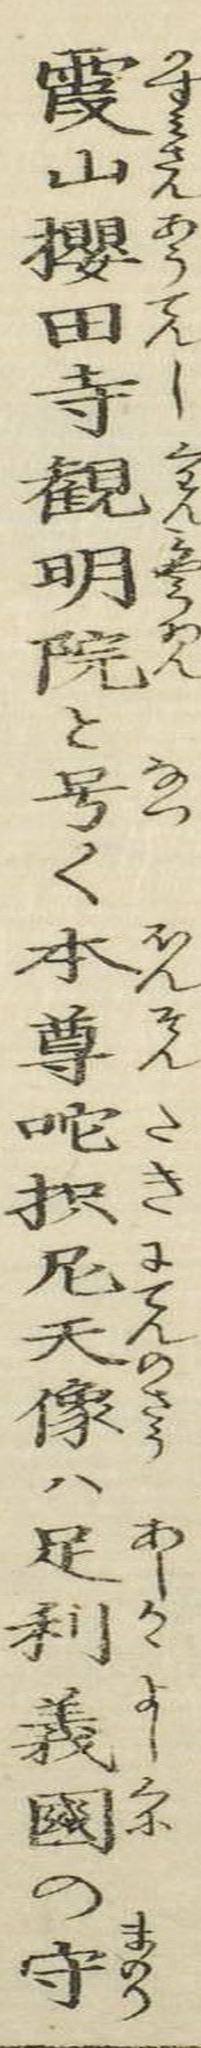霞山櫻田寺観明院と号く本尊咜抧尼天像は足利義國の守
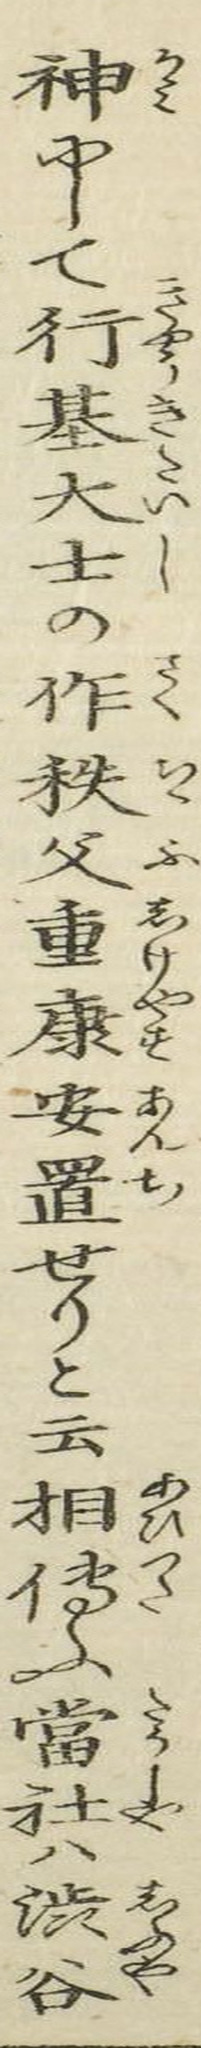神にして行基大士の作秩父重康安置せりと云相傳ふ當社は渋谷
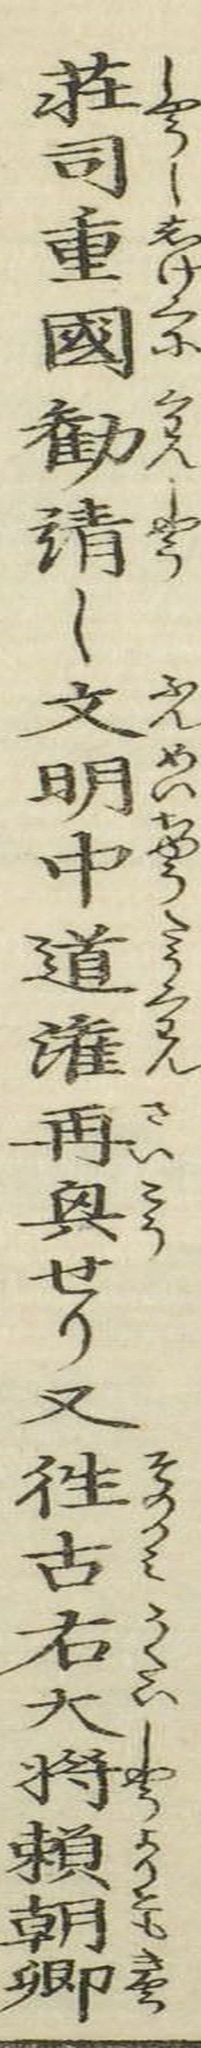荘司重國勧請し文明中道灌再興せり又往古右大將頼朝卿
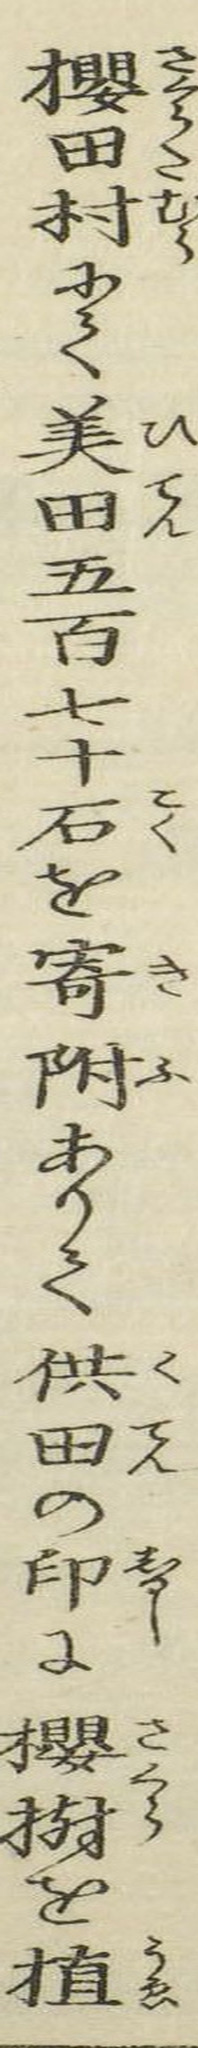櫻田村にて美田五百七十石を寄附ありて供田の印に櫻樹を植
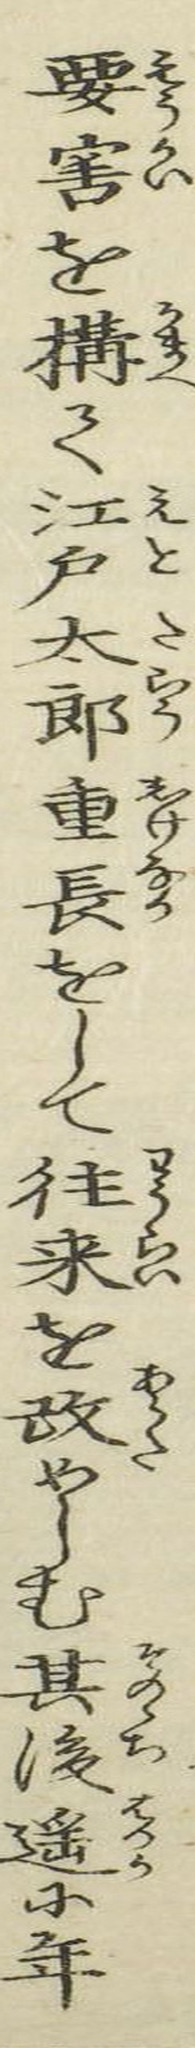要害を搆て江戸太郎重長をして往来を改めしむ其後遥に年
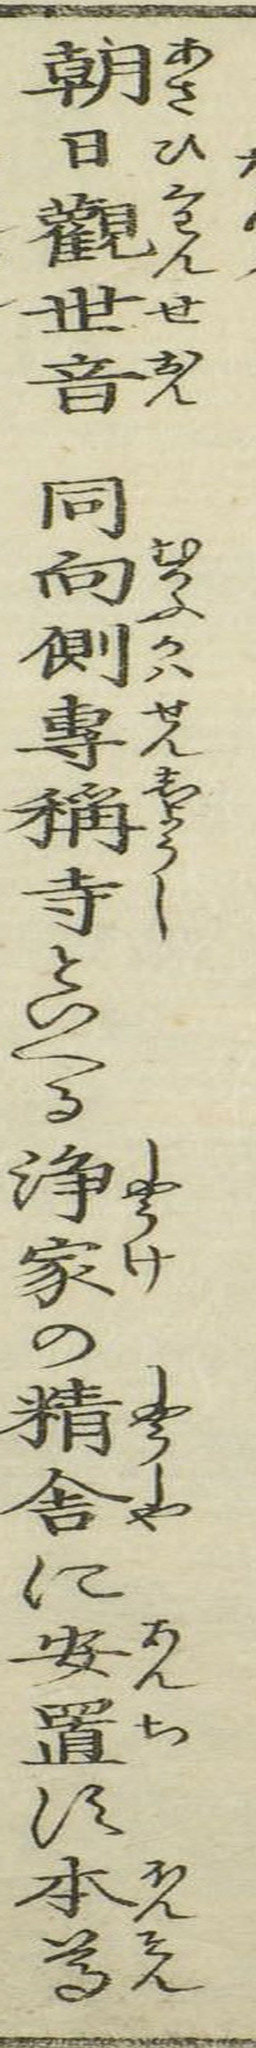朝日觀世音同向側專稱寺といへる浄家の精舎に安置す本尊
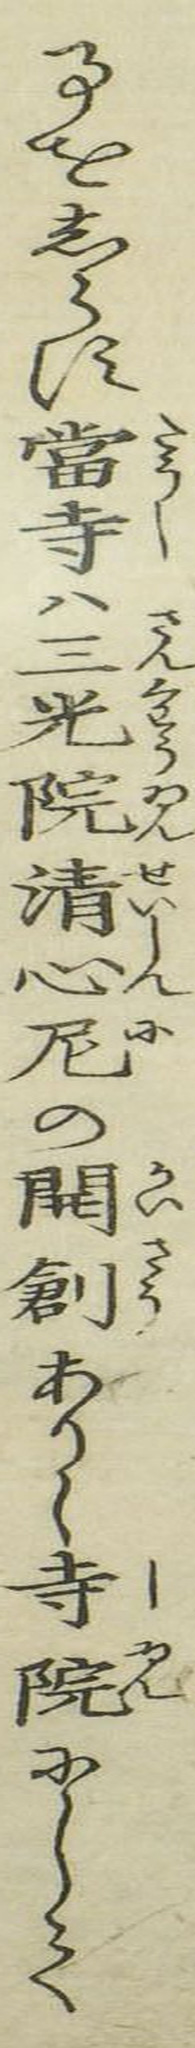事をしらす當寺は三光院清心尼の開創ありし寺院にして

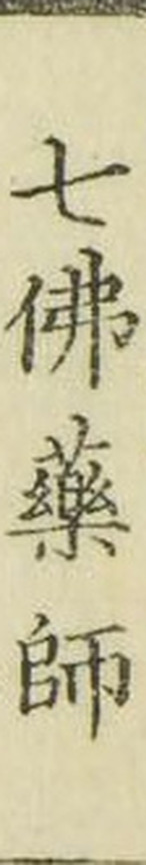七佛藥師
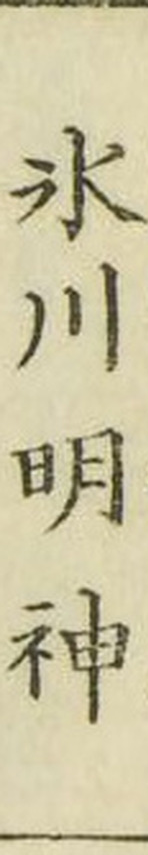氷川明神

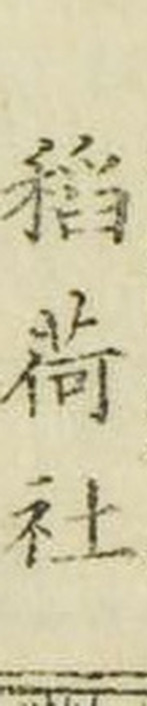稻荷社
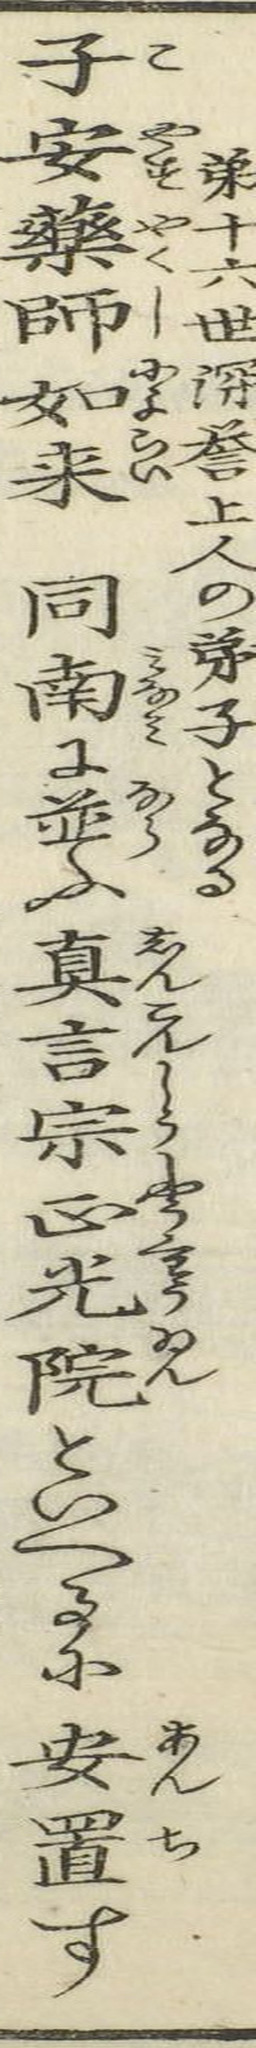子安藥師如来同南に並ふ真言宗正光院といへるに安置す
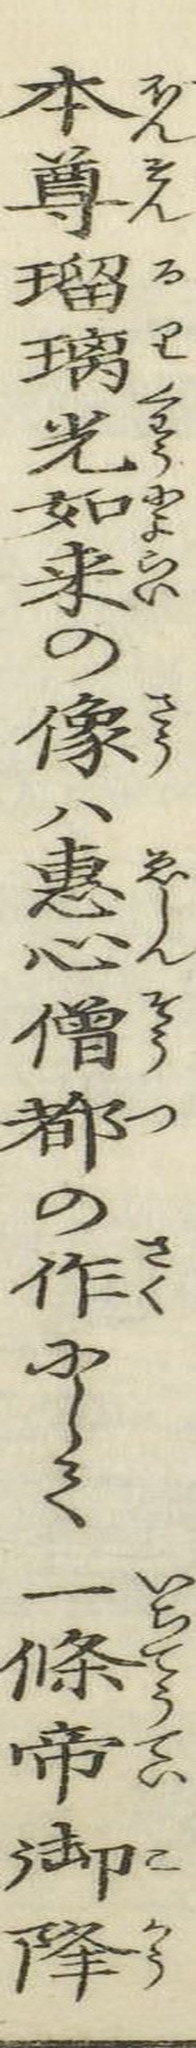本尊瑠璃光如来の像は恵心僧都の作にして一條帝御降
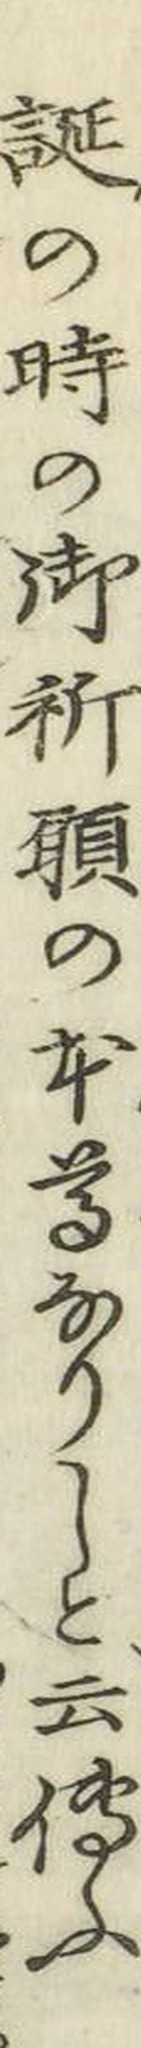誕の時の御祈願の本尊なりしと云傳ふ
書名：江戸名所図会 20巻 巻之7
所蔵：東京学芸大学教育コンテンツアーカイブ
